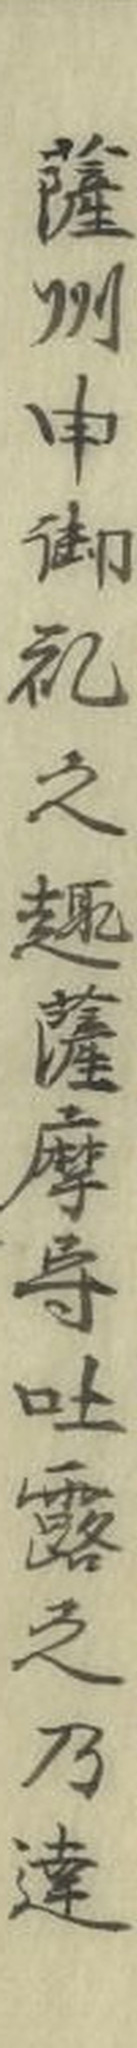薩州申御礼之趣薩摩守吐露之及達
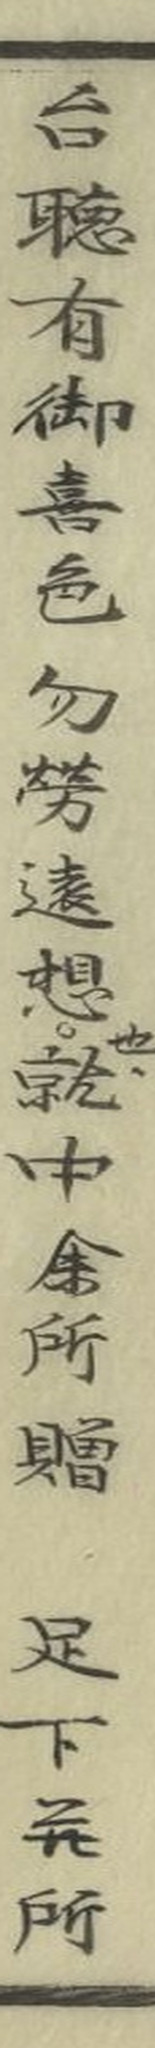台聴有御喜色勿労遠想也就中余所贈足下幷所
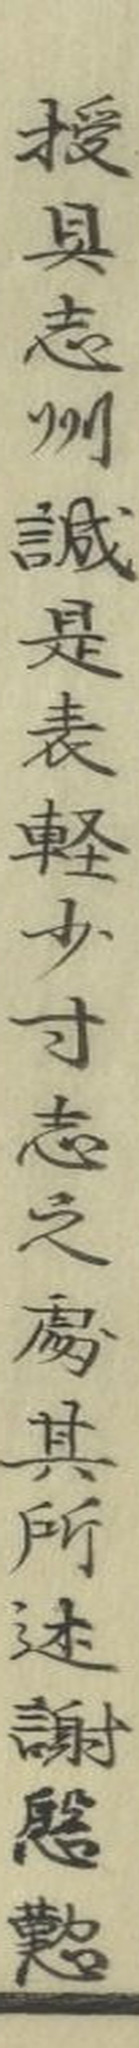授具志州誠是表軽少寸志之処其所述謝慇懃
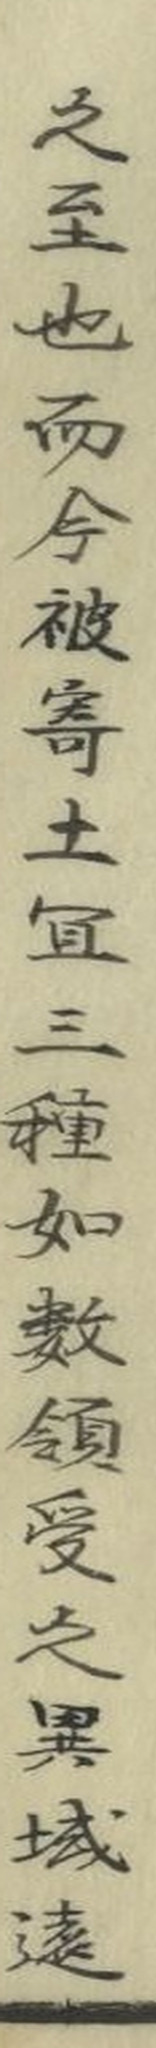之至也而今被寄土冝三種如数領受之異域遠
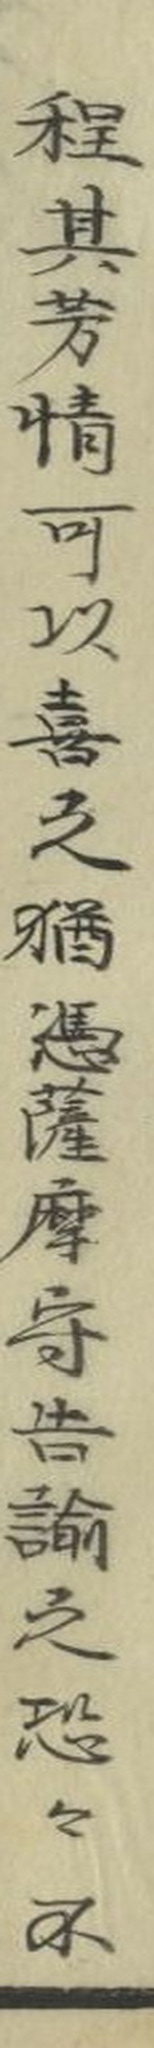程其芳情可以喜之猶馮薩摩守告諭之恐々不

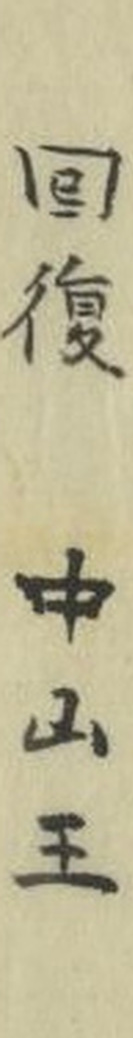回復中山王
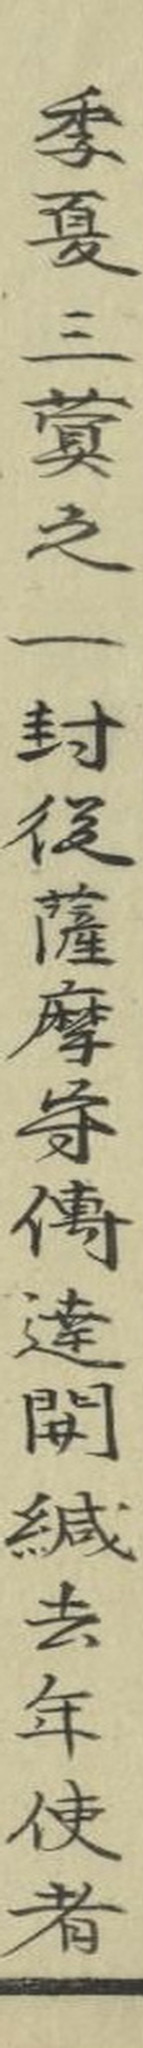季夏三冥之一封従薩摩守伝達開緘去年使者
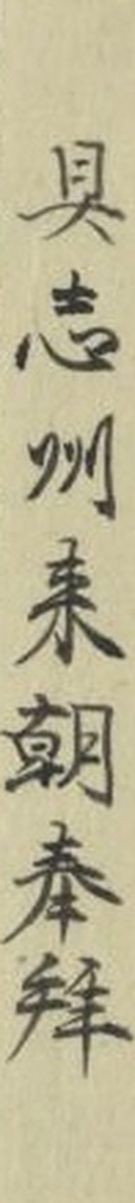具志州来朝奉拝
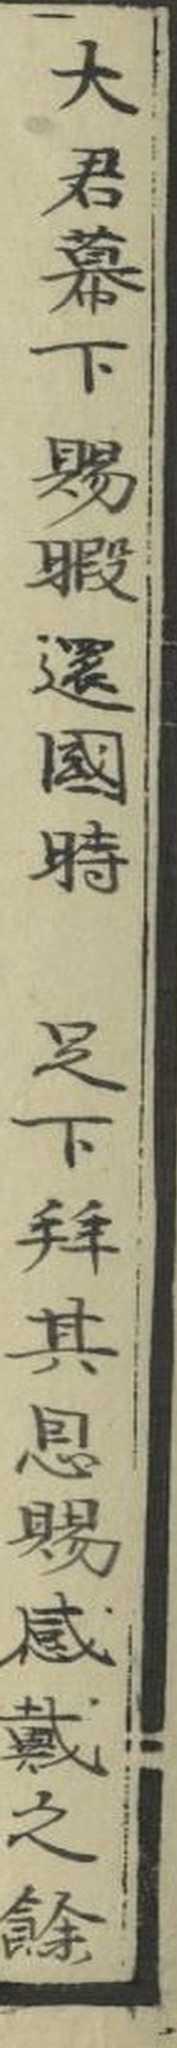大君幕下賜暇還国時足下拝其恩賜感載之余
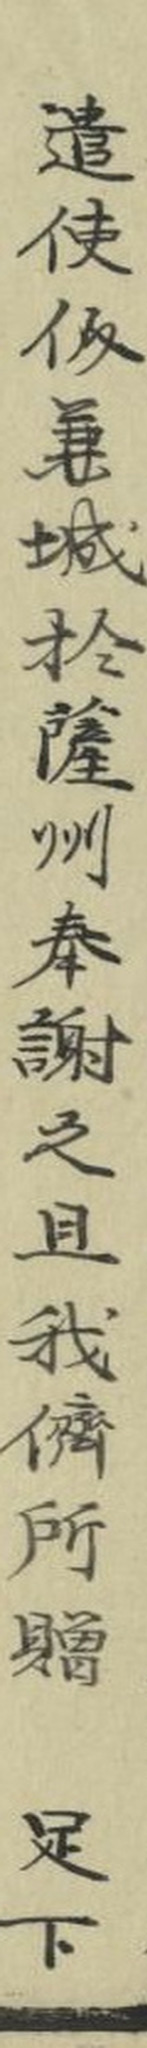遣使价兼城於薩州奉謝之且我儕所贈足下
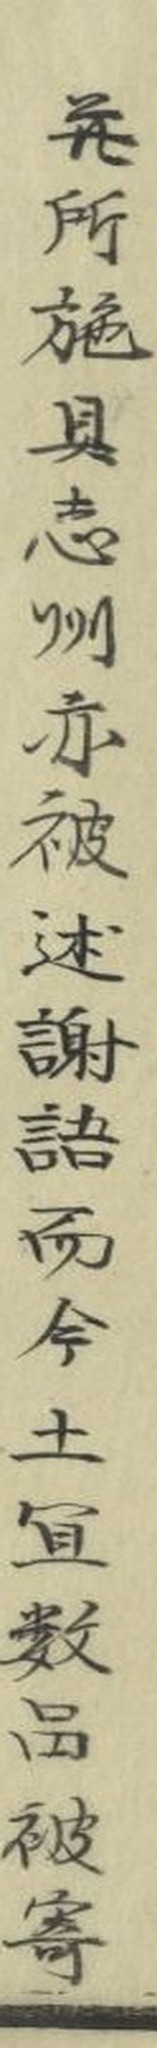幷所施具志州亦被述謝語而土冝数品被寄
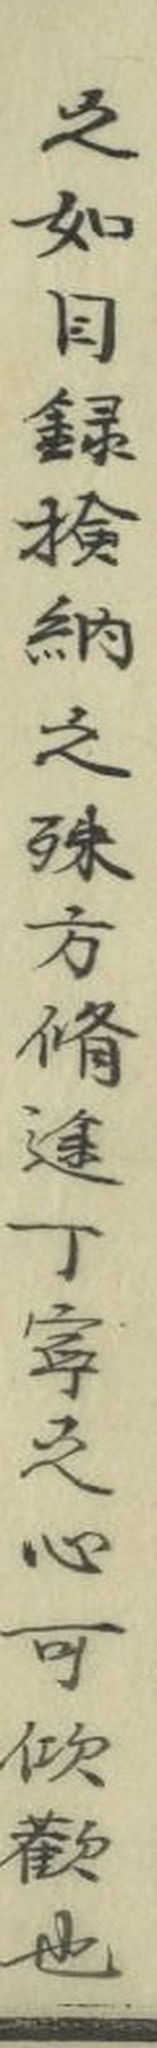之如目録検納之殊方脩途丁寧之心可傾歓也
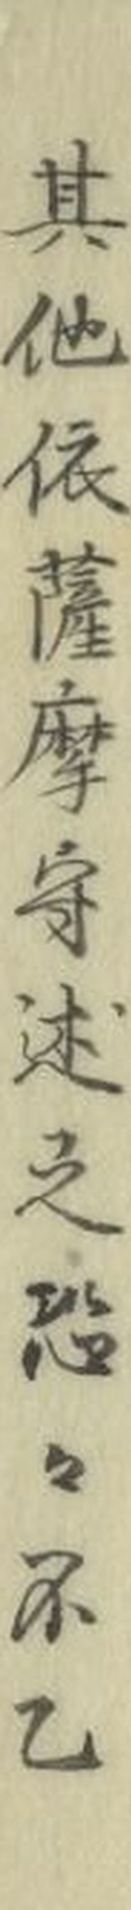其他依薩摩守述之恐々不乙
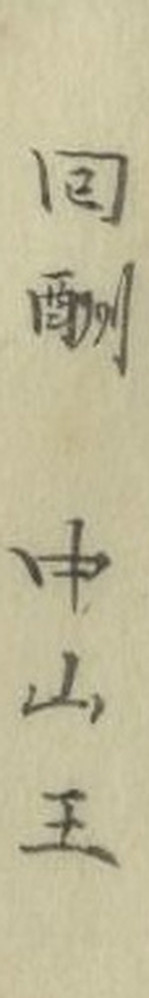回復中山王

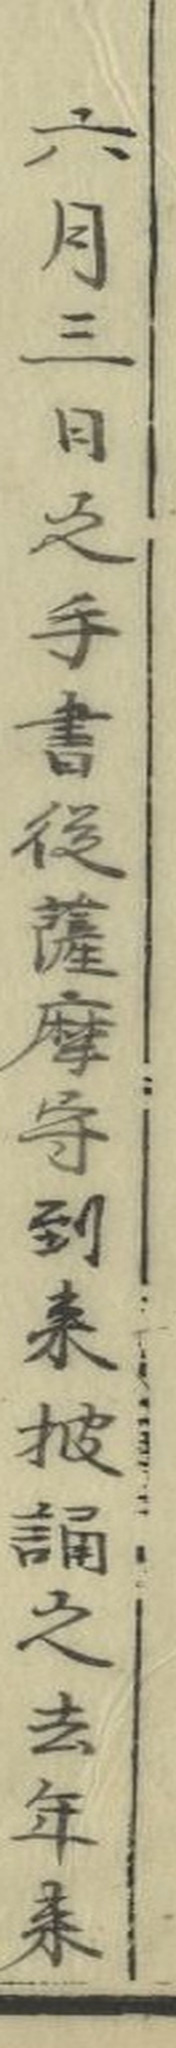六月三日之手書従薩摩守到来披誦之去年来
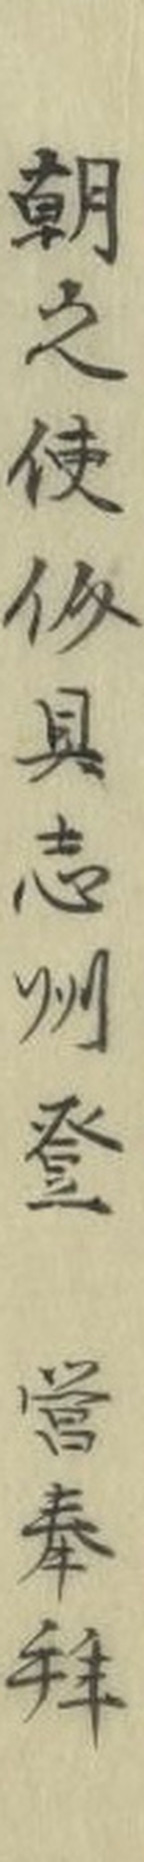朝之使价具志州登営奉拝
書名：琉球往来（上）
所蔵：University of the Ryukyus Library
